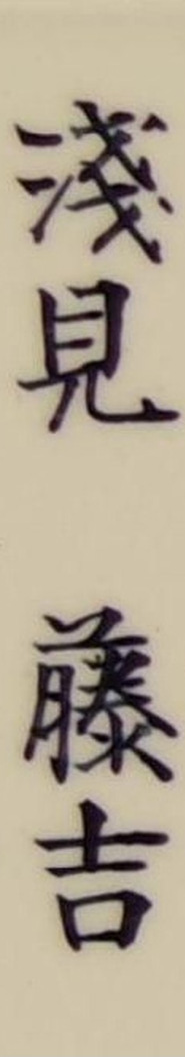浅見藤吉
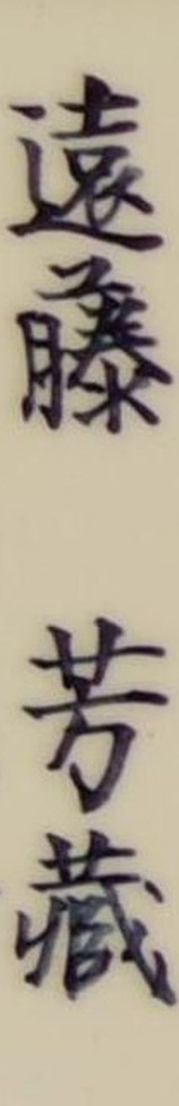遠藤芳蔵
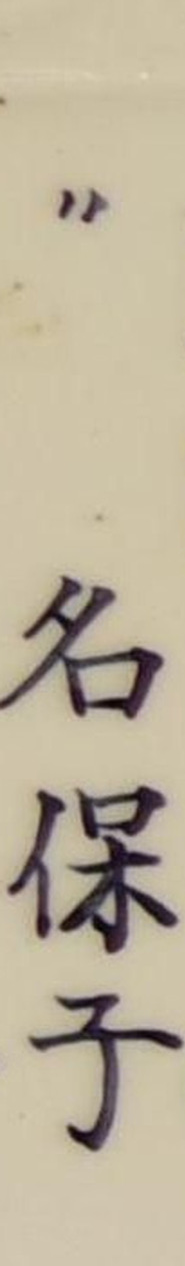名保子
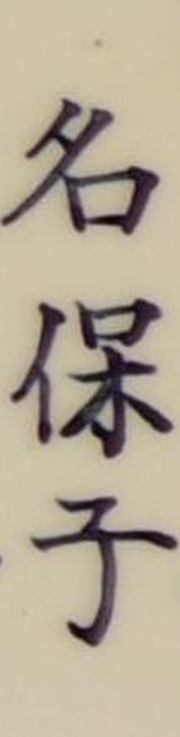名保子
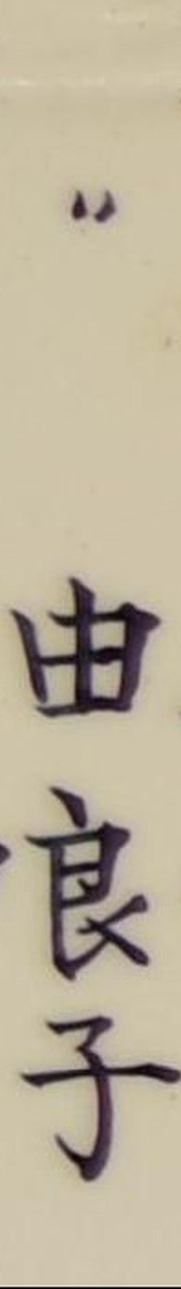由良子
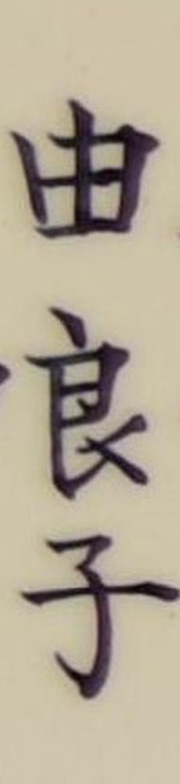由良子

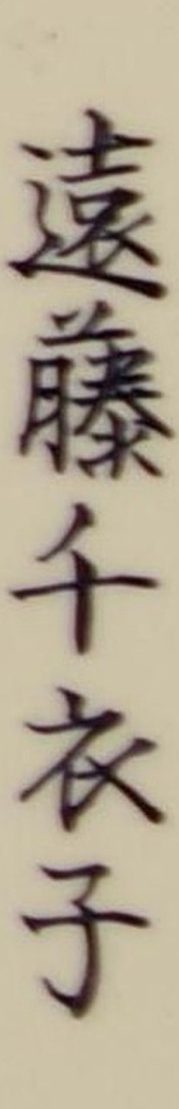遠藤千衣子
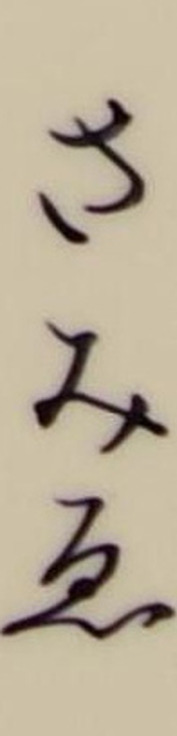さみゑ
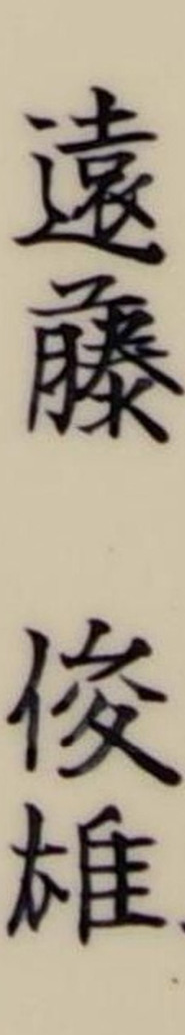遠藤俊雄
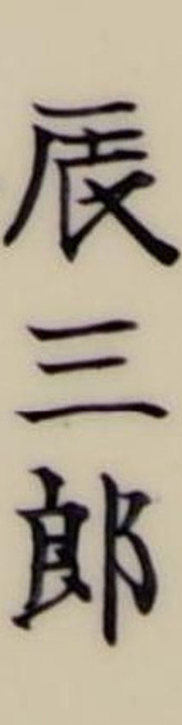辰三郎
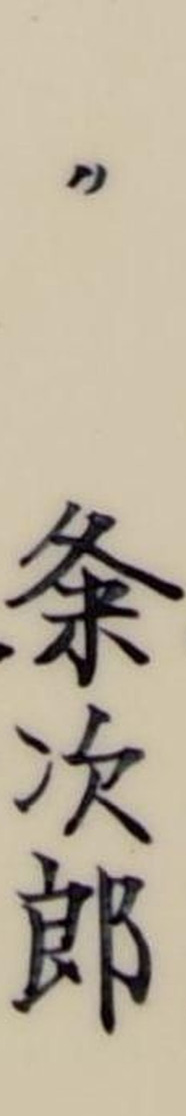粂次郎
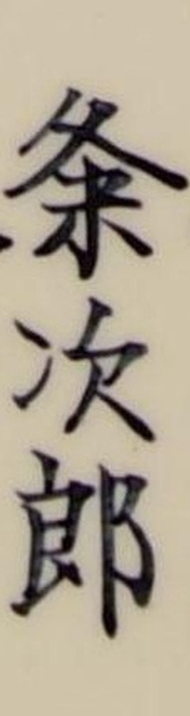粂次郎
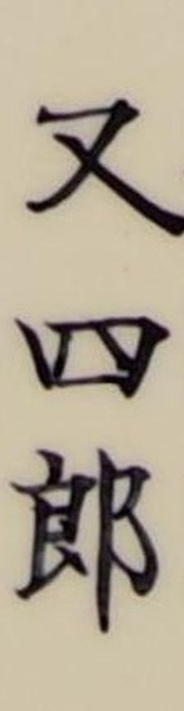又四郎
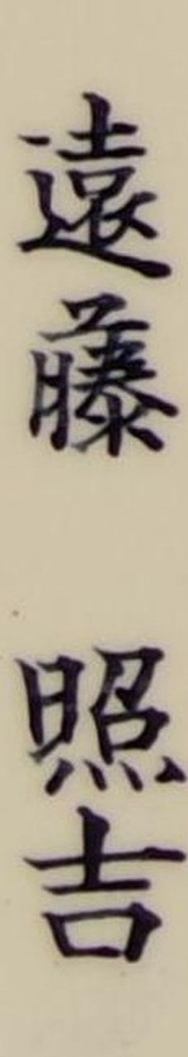遠藤照吉
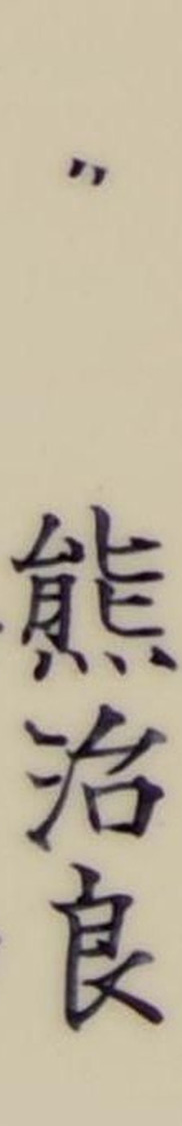熊治良
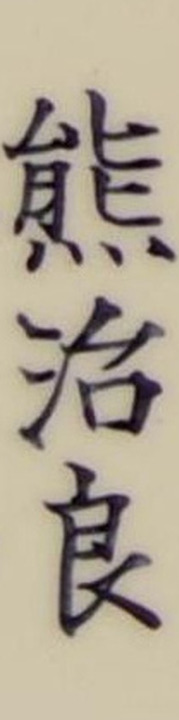熊治良
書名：E~L
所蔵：高野山金剛峯寺
